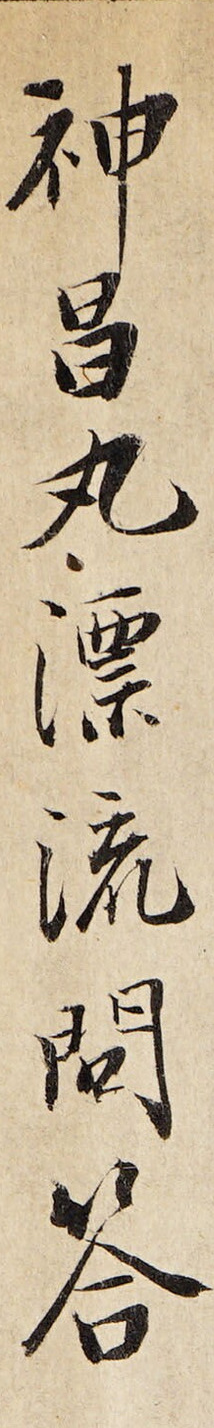神昌丸漂流問答

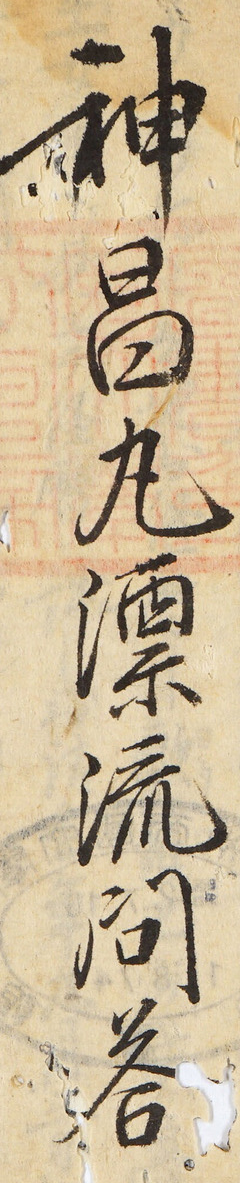神昌丸漂流問答

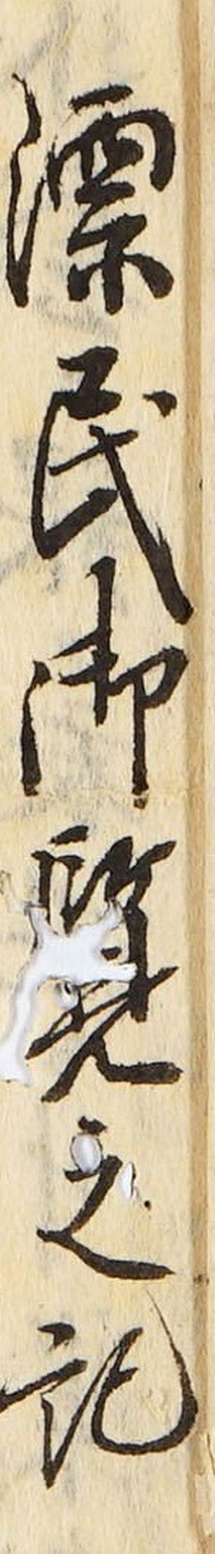漂民御覧之記
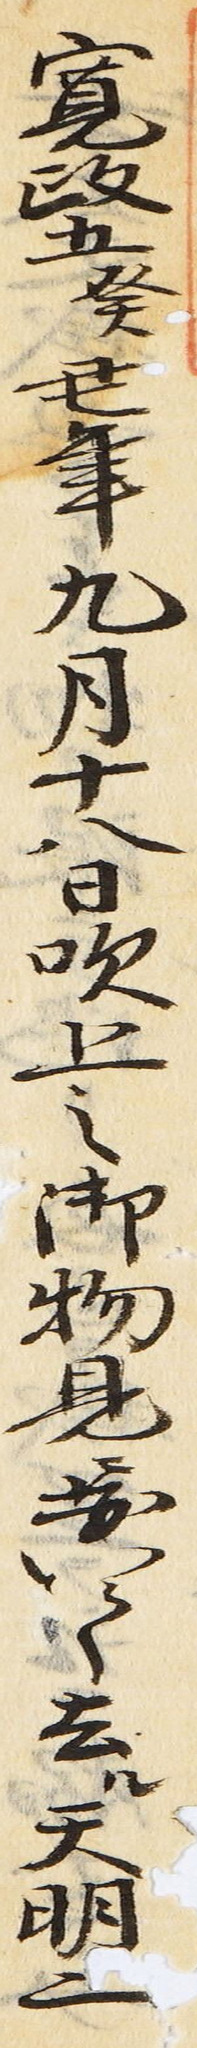寛政五癸丑年九月十八日吹上之御物見にをいて去る天明二
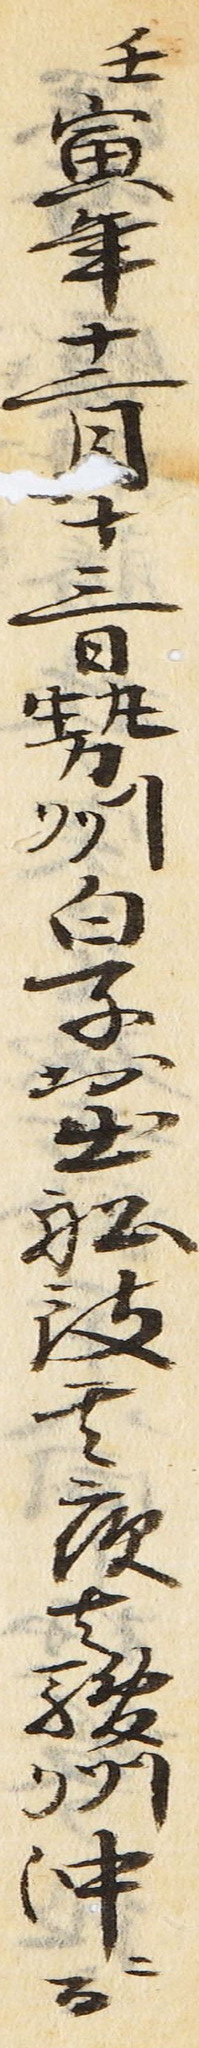壬寅年十二月十三日勢州白子を出船致其夜は駿州沖にて
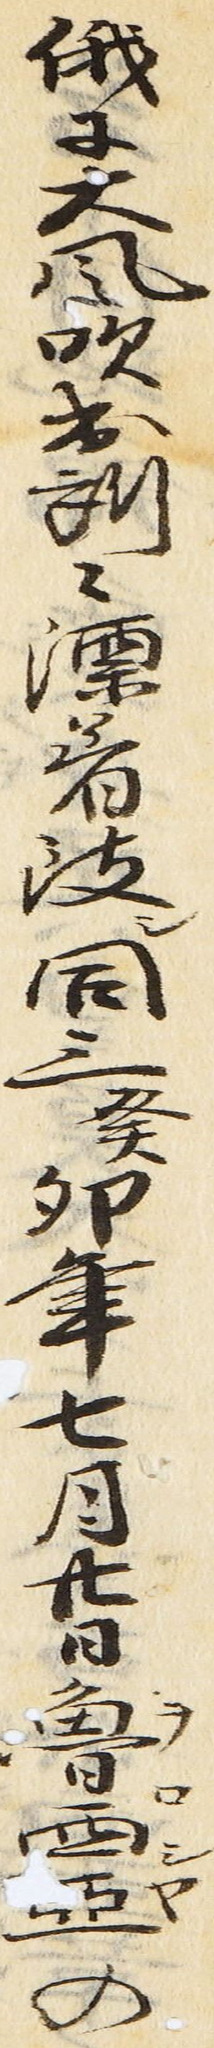俄に大風吹出所々漂着致し同三癸卯年七月廿日魯西亜の
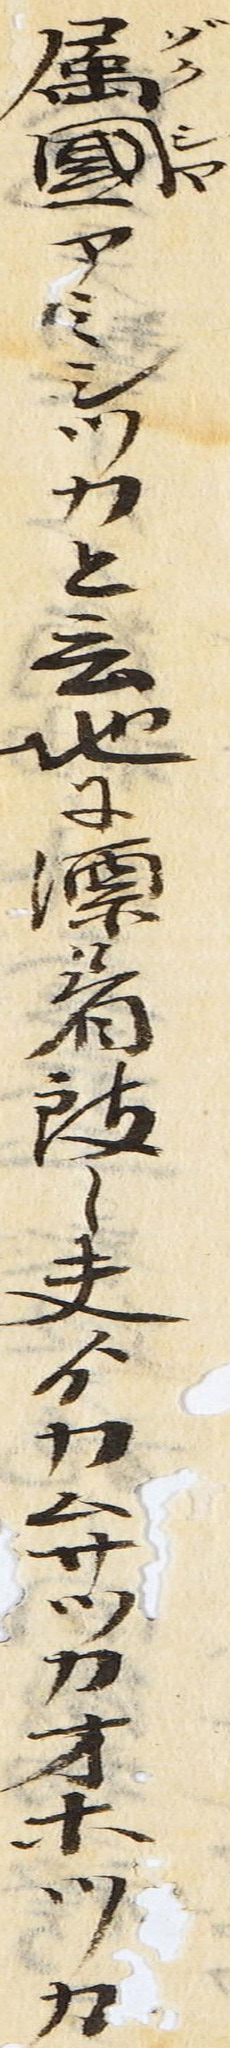属国アミシツカと言地に漂着致し夫ゟカムサツカオホツカ
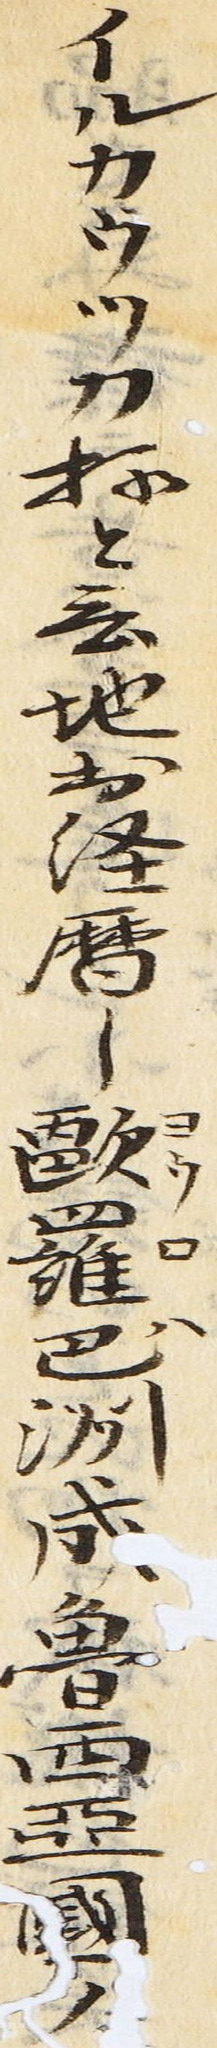イルカウツカ抔と言地を径暦し欧羅巴洲成る魯西亜国の
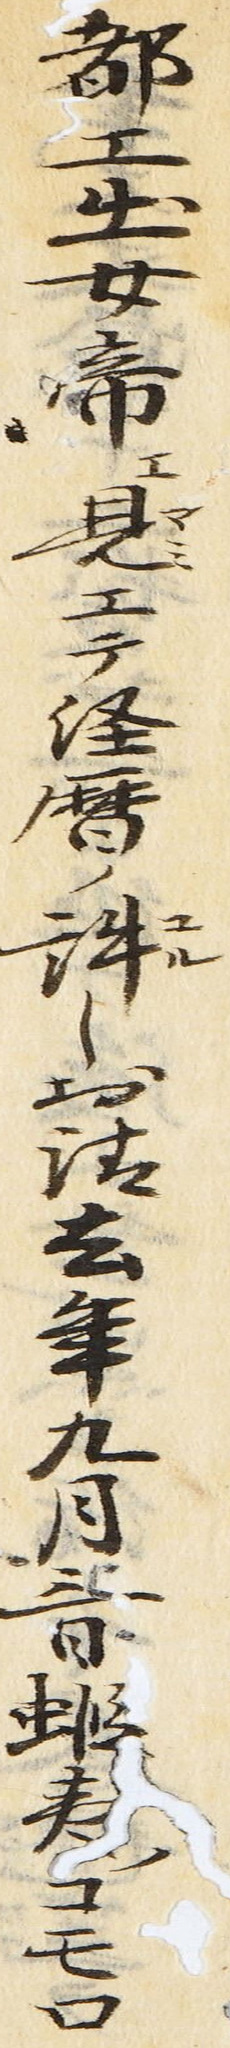都え出女帝え見えて径暦の許しを請去年九月三日蝦夷のコモロ
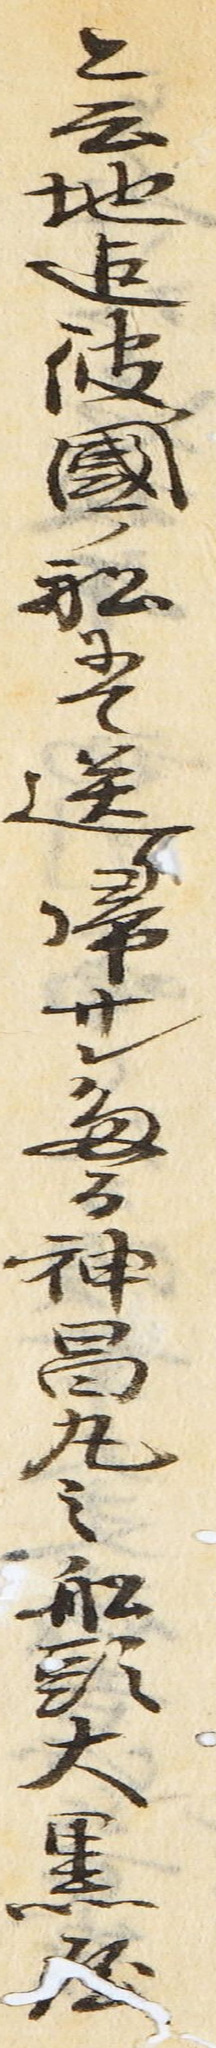と云地迄彼の国の船にて送り帰されたる神昌丸之船頭大黒屋
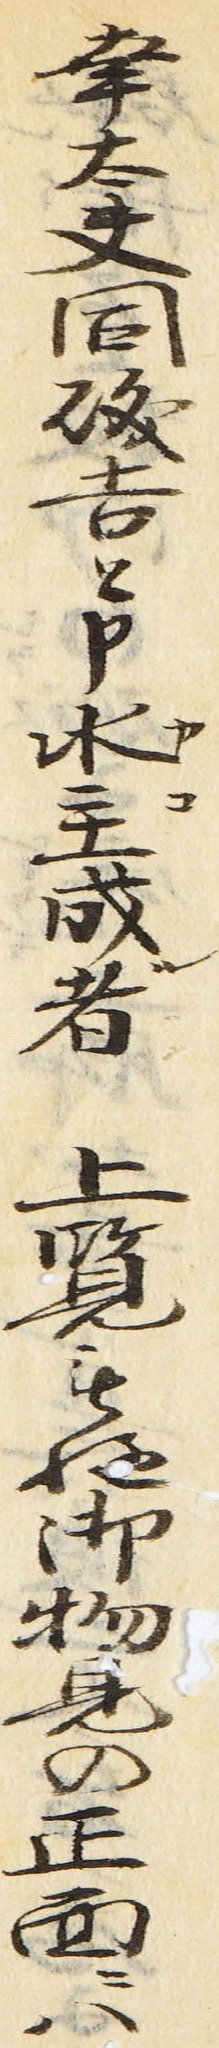幸太夫同磯吉と申水主成る者上覧被遊御物見の正面には
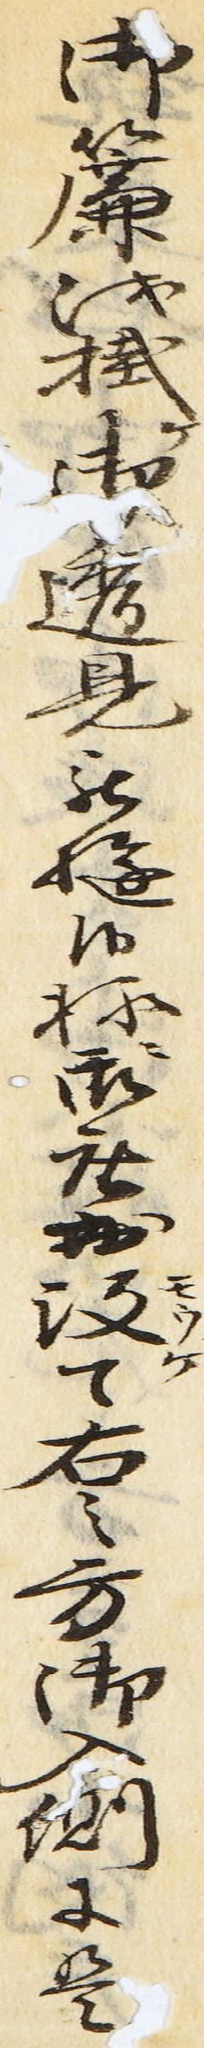御簾を掛け御透見被遊候様に御座を設て右之方御入側には
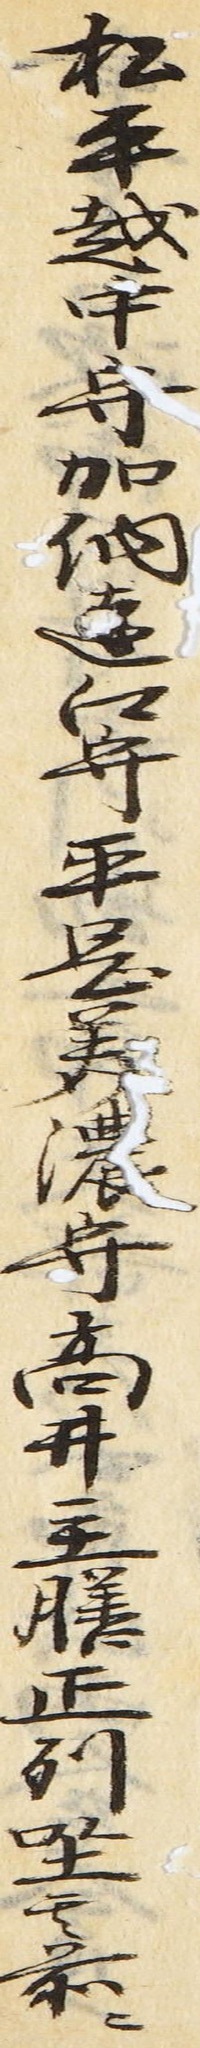松平越中守加納遠江守平岡美濃守高井主膳正列座其前に
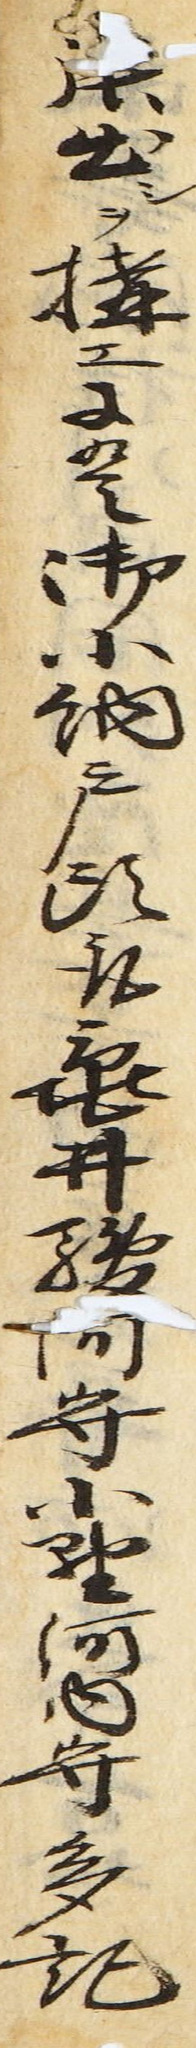張出しを構えには御小納戸頭取亀井駿河守小野河内守多記

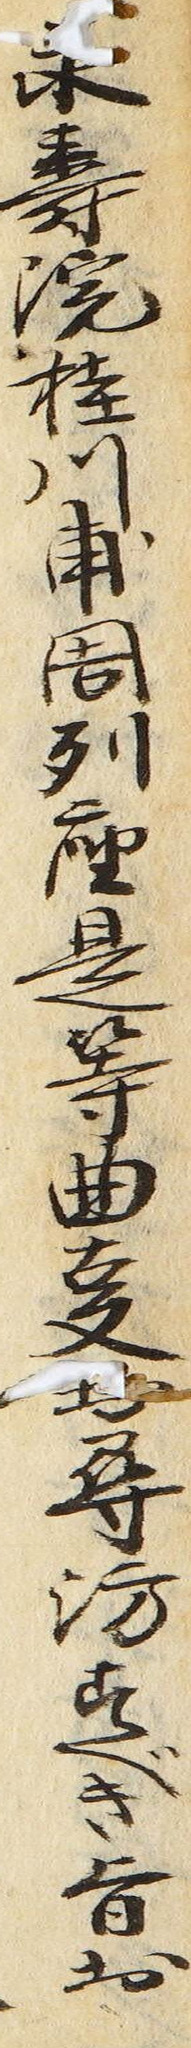永寿院桂川甫周列座是等曲事お尋訪すべき旨お
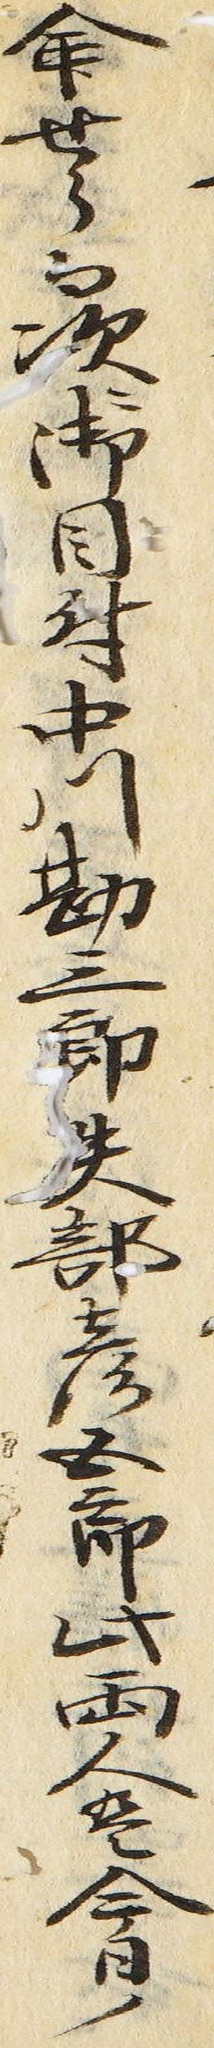命せらる次に御目付中川勘三郎矢部彦五郎此両人は今日の
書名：神昌丸漂流問答
